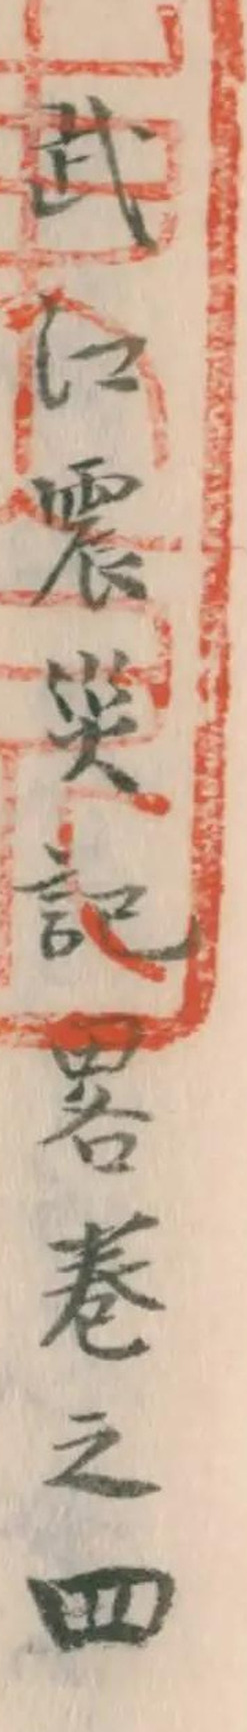武江震災記略巻之四
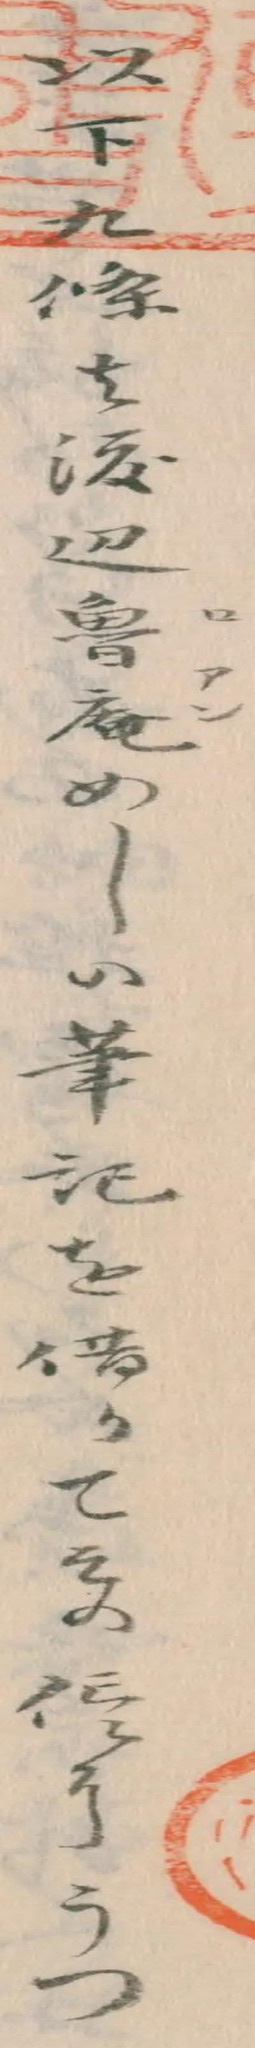以下九條は渡辺魯庵めしい筆記を借りてその儘にうつ
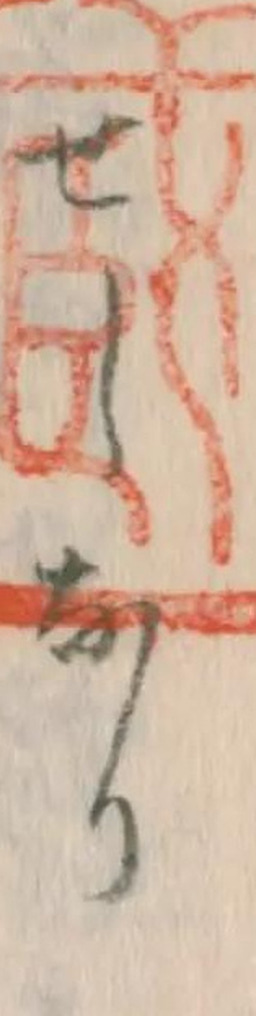せしなり
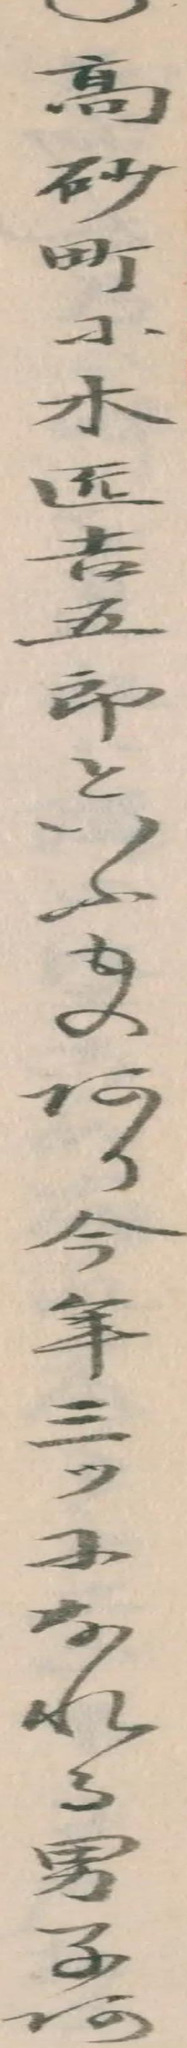○高砂町に木匠吉五郎と云ふものあり今年三ツになれる男子あ
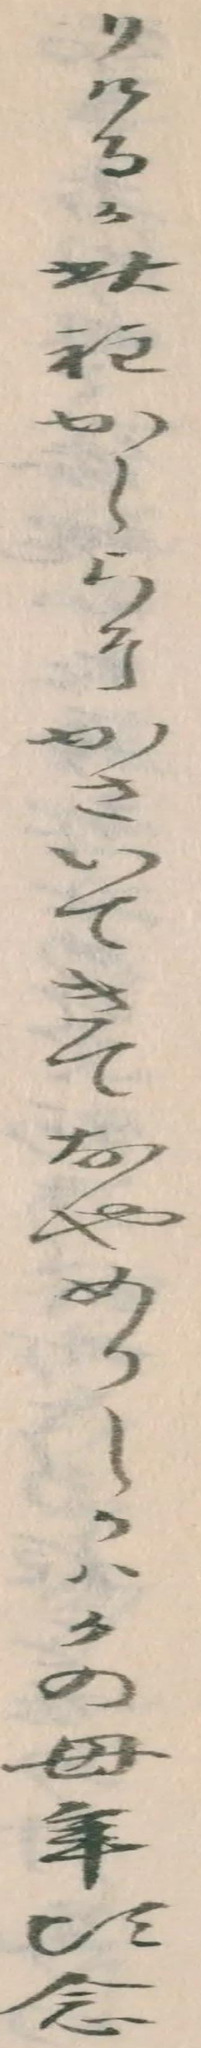りけるか此程かしらにかさいてきてなやめりしかはかの母年頃念
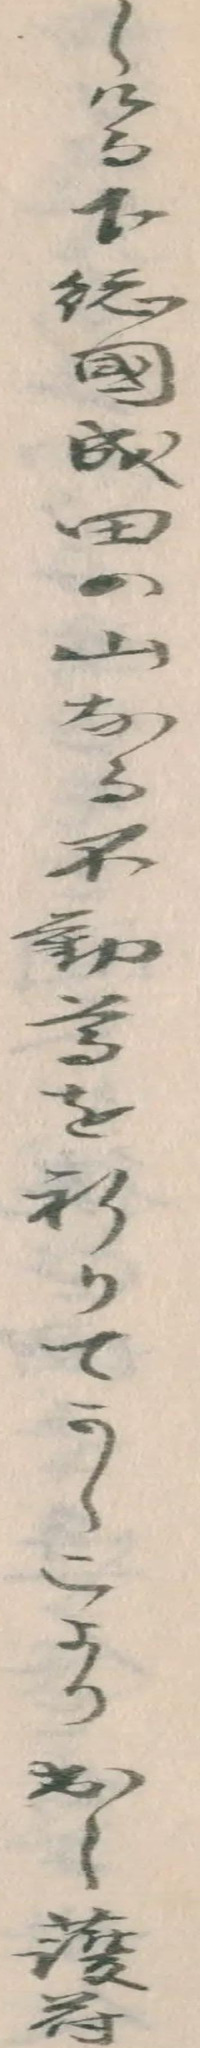しける下総国成田の山なる不動尊を祈りてかしこより出し護符
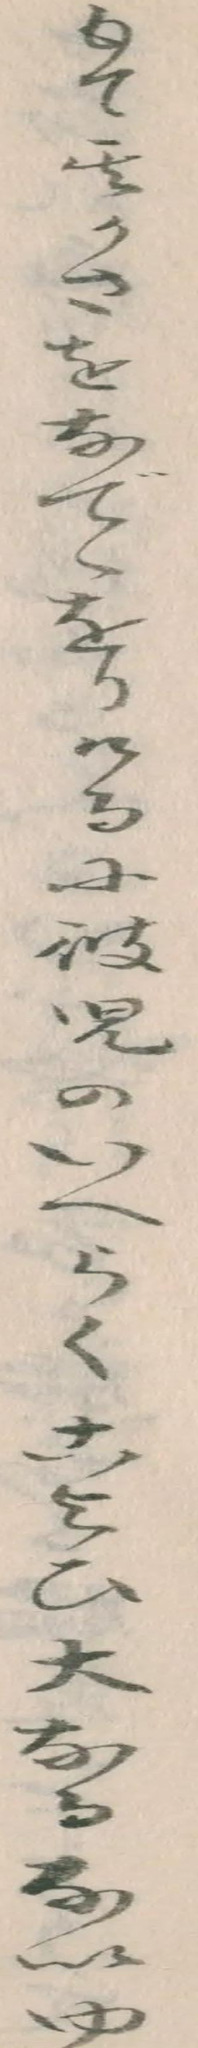もて其かさをなでゝをりけるに彼児のいへらくこよひ大なるないゆ
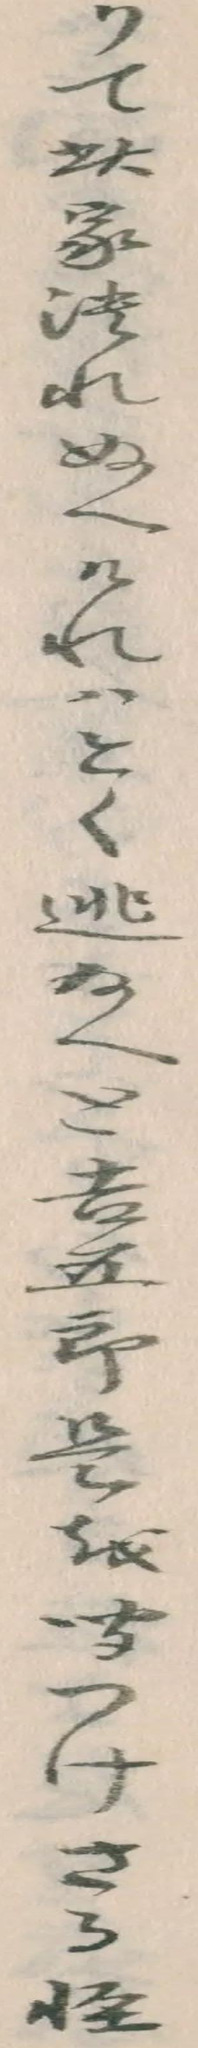りて此家潰れぬへけれはとく逃給へと吉五郎是を聞つけさる怪
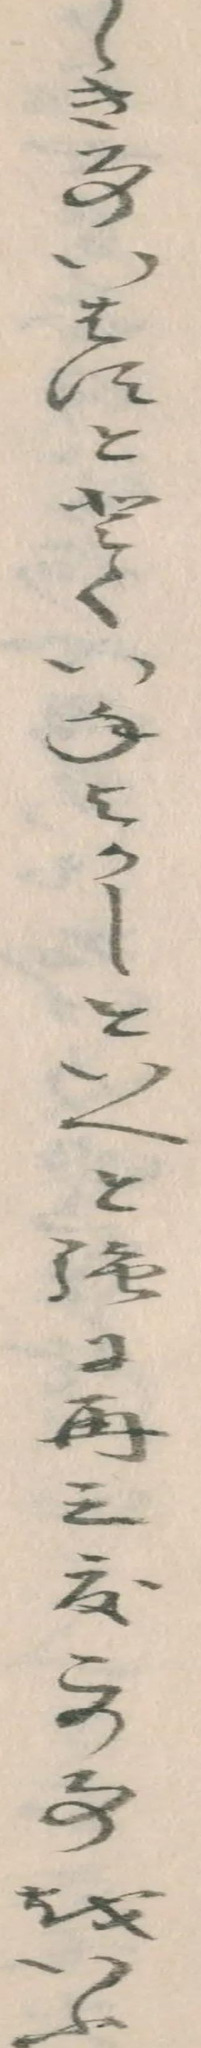しき事いはすととくいねよかしといへと強に再三度この事をいふ
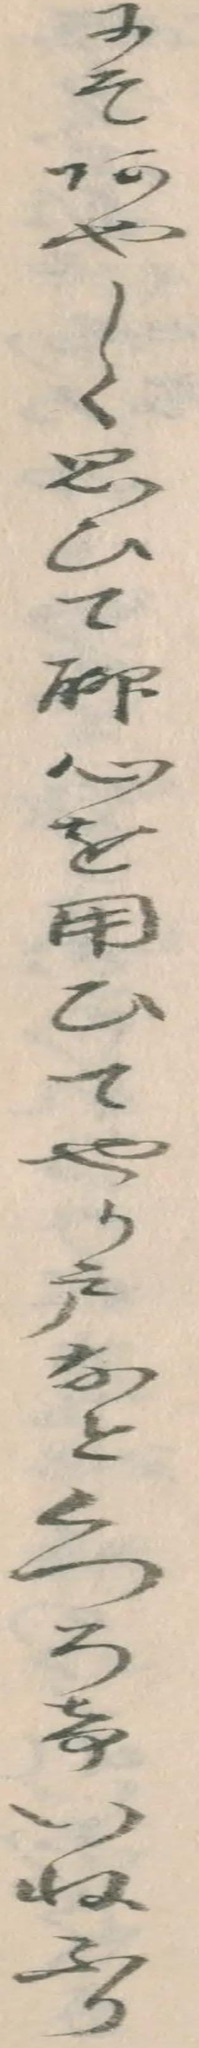にそあやしく思ひて聊心を用いてやり戸なとくつろけいねふり

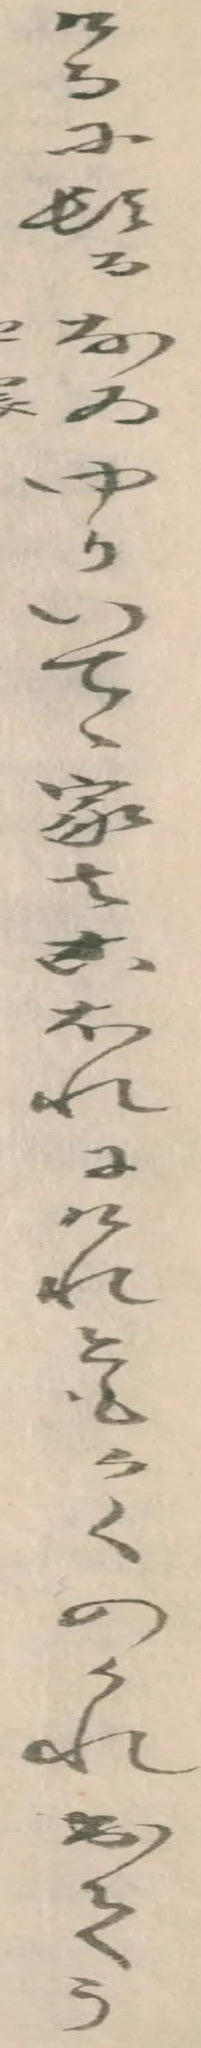けるに頓而なゐ地震ゆりいてゝ家はこほれにけれともかくのかれ出てう
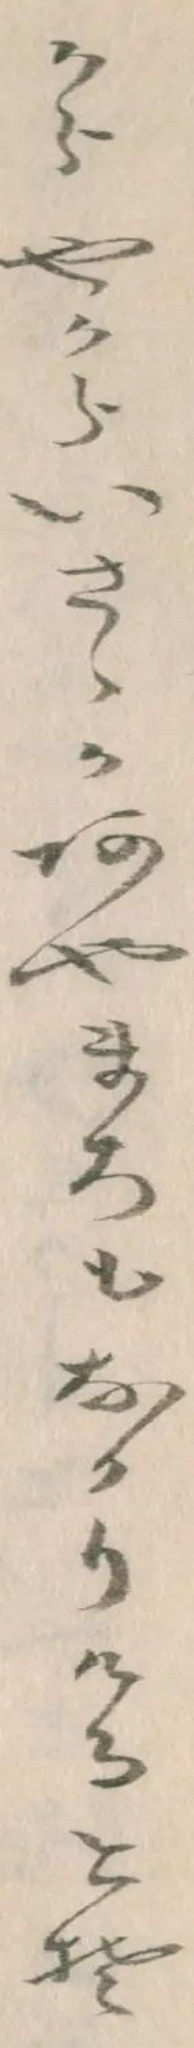からやからいさゝかあやまちもなかりけるとそ
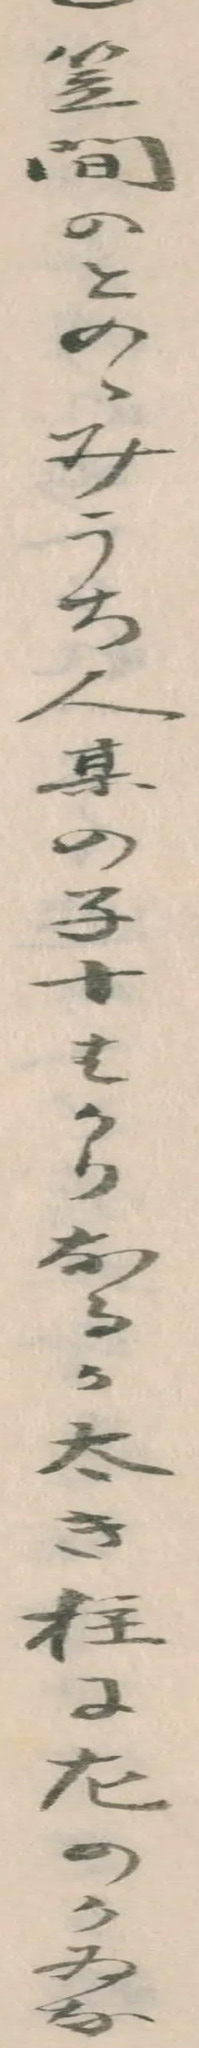○笠間のとのゝみうち人某の子十はかりなるか太き柱に左のかゐな
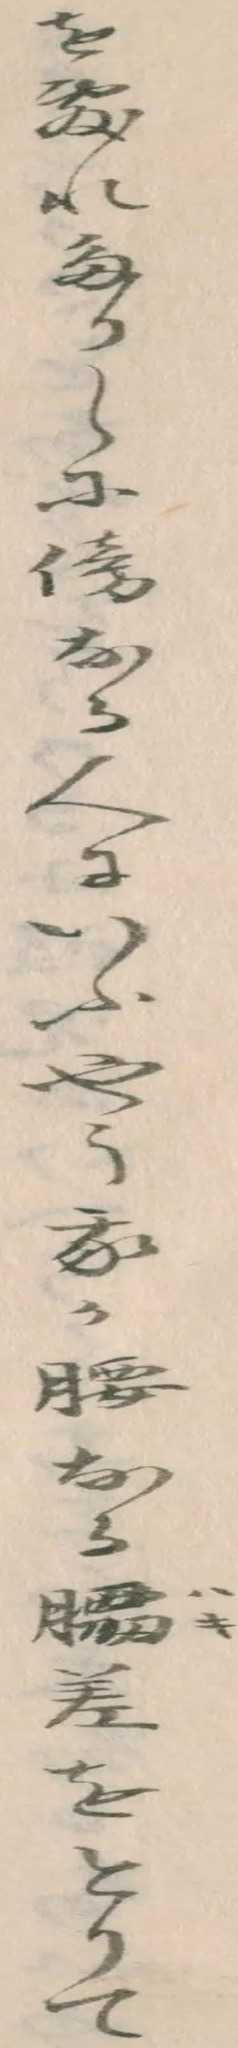を敷れたりしに傍なる人にいふやう我か腰なる脇差をとりて
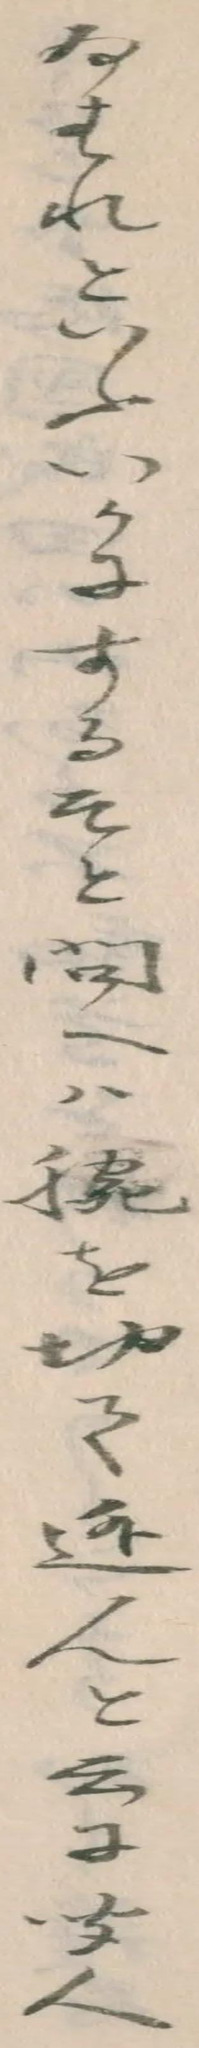給はれといふいかにするそと問へは腕を切て逃んと云に聞人
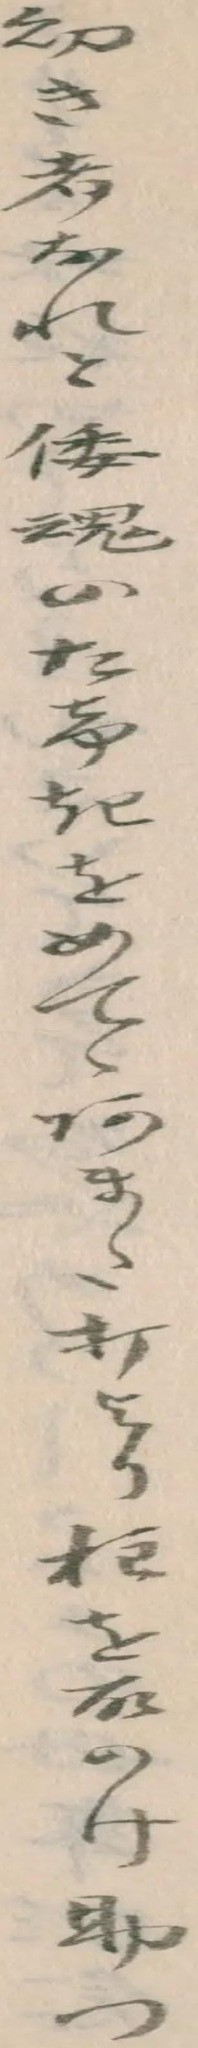幼き者なれと倭魂のたけきをめてゝあまた打より柱を取のけ助つ
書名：地災撮要. 巻10(地震之部) 上,下
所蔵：国立国会図書館 National Diet Library, JAPAN
